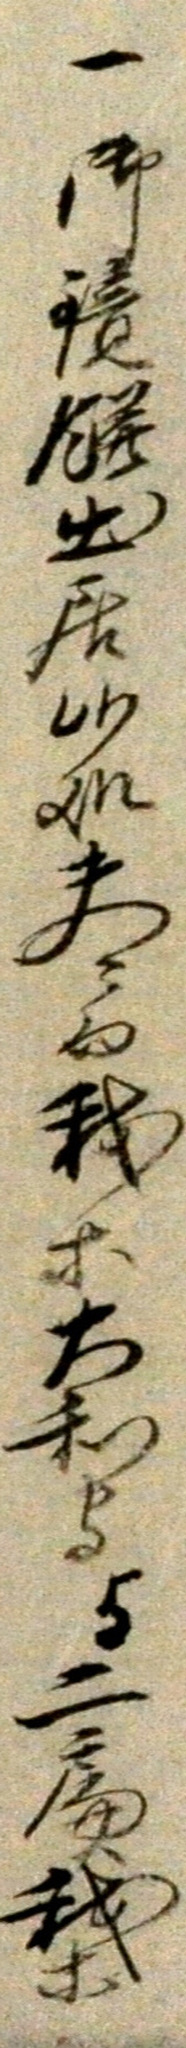一御鏡餅出居候処夫ニ而我等大和守と二遍我等
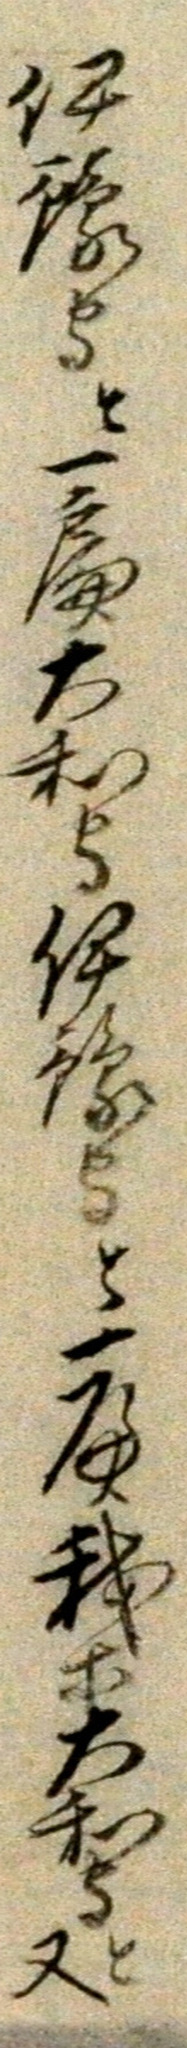伊豫守と一遍大和守伊豫守と一遍我等大和守と又
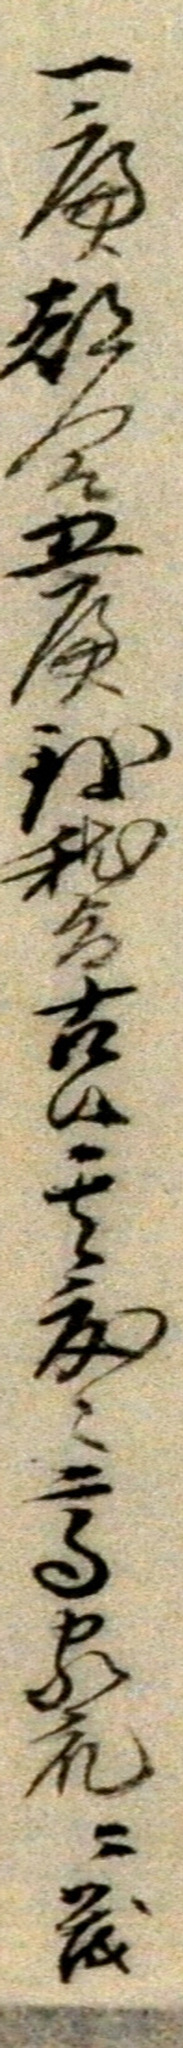一遍都合五遍致稽古候其度ニ高家衆ニも
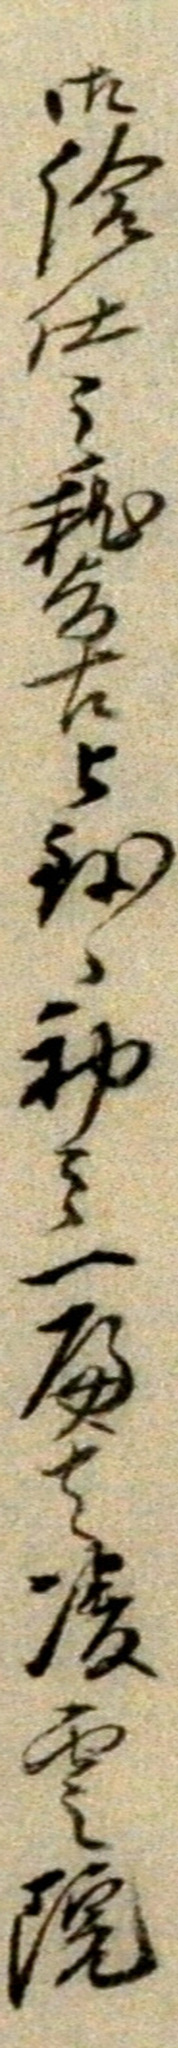御給仕之稽古被致候初之一遍は凌雲院
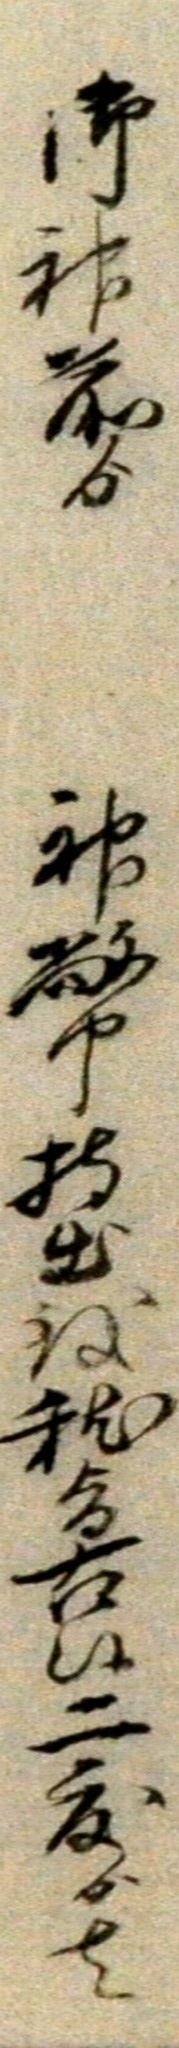御神前ゟ神幣持出致稽古候二度ゟは
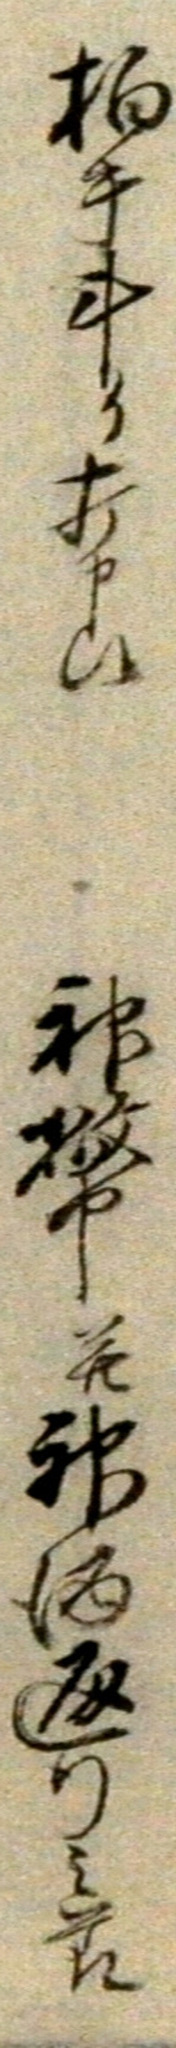柏手計り打申候神幣并神酒通り之節
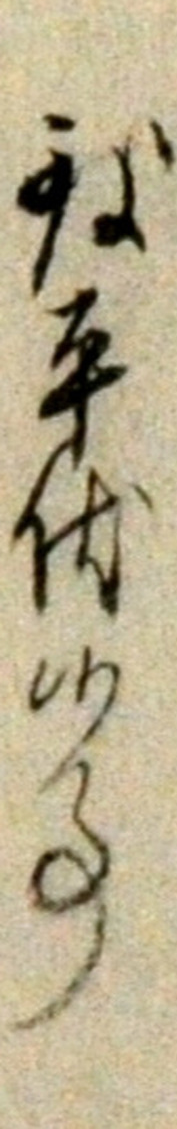致平伏候事

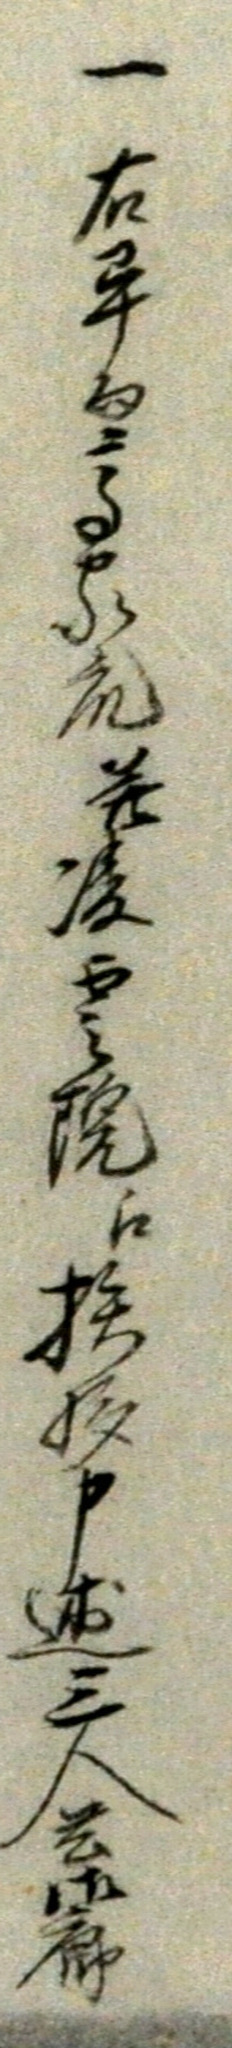一右畢而高家衆并凌雲院え挨拶申述三人共御廊
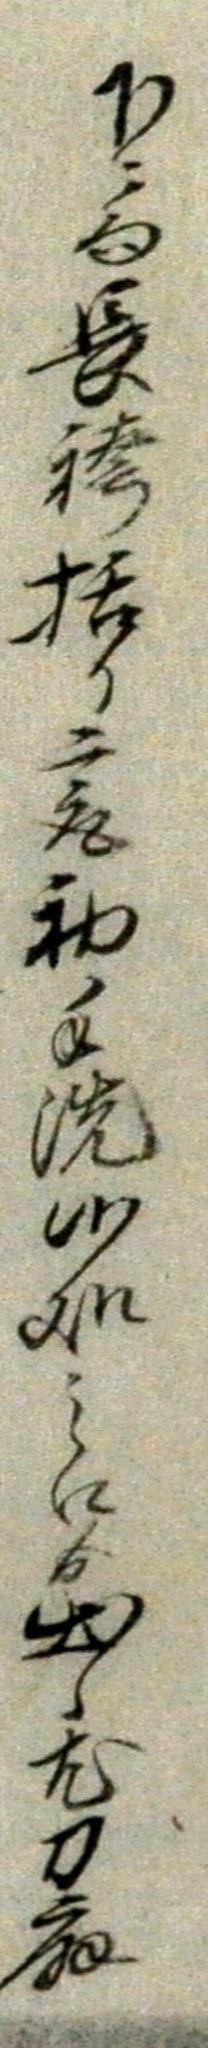下ニ而長袴括り最初手洗候処之口ゟ出候尤刀扇
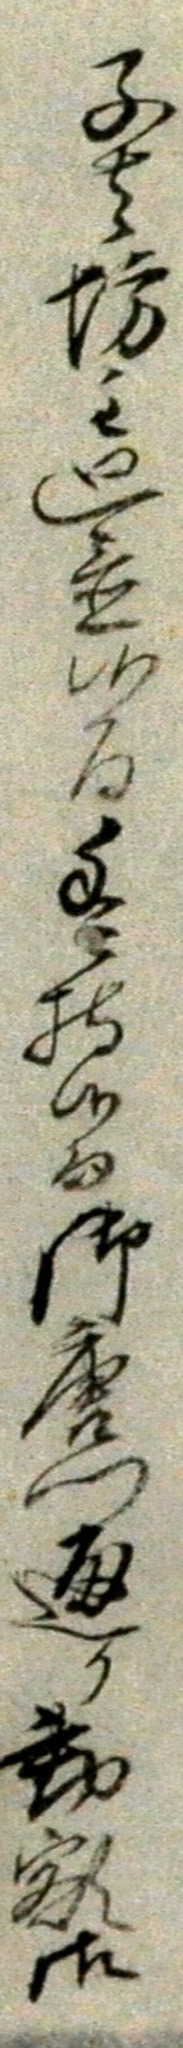子は坊主廻置候間手ニ持候而御唐門通り勅願御
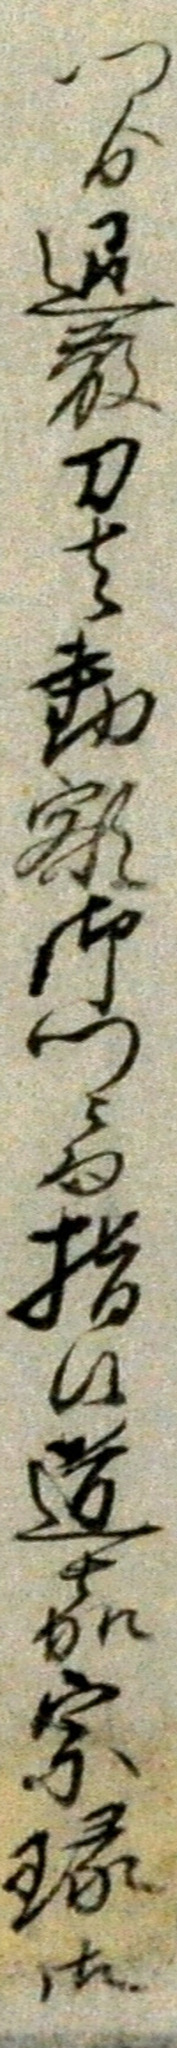門ゟ退散刀は勅願御門ニ而指候道嘉宗録御
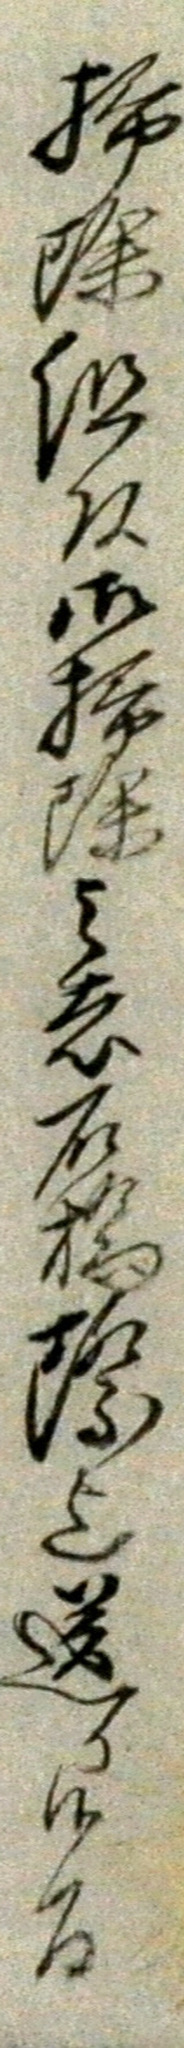掃除組頭御掃除之者石橋際迄送り候間
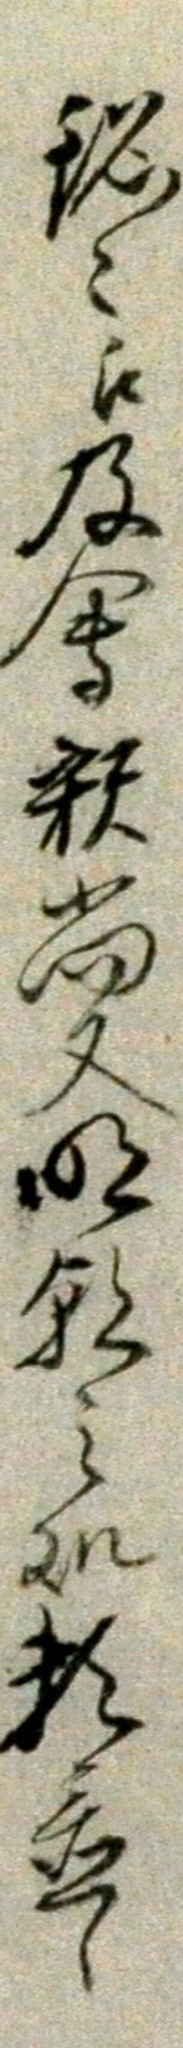銘々え及会釈尚又明朝之処頼置候
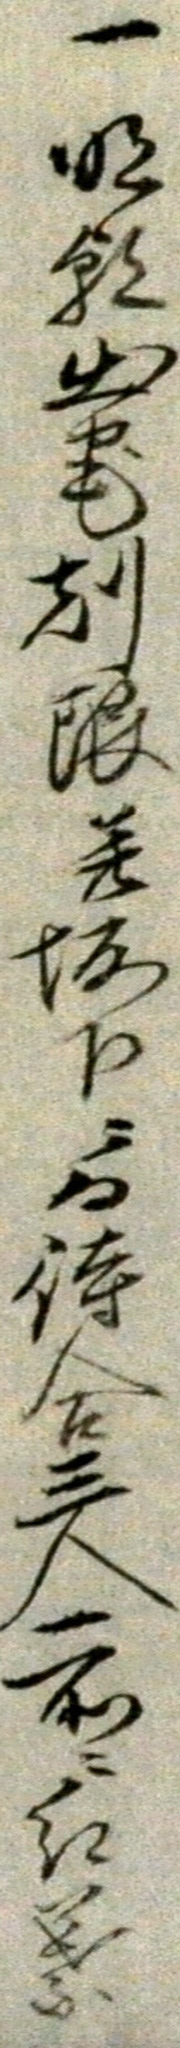一明朝出宅刻限并坂下ニ而待合三人一所ニ紅葉
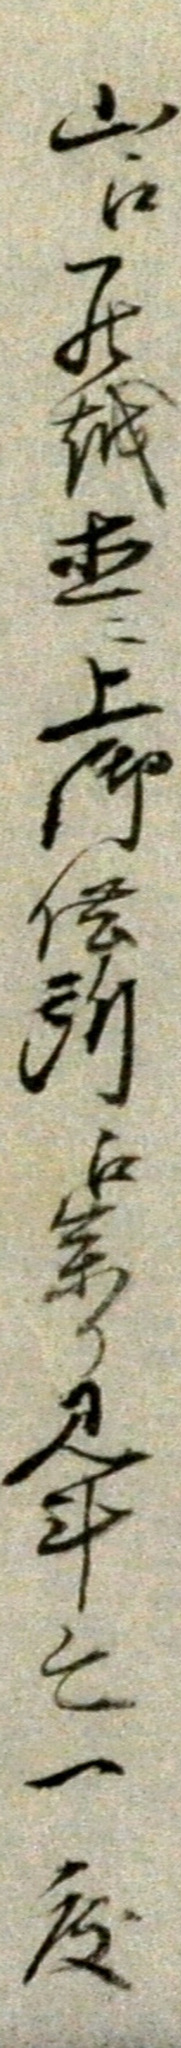山え罷越直ニ上御供所え参り見計今一度
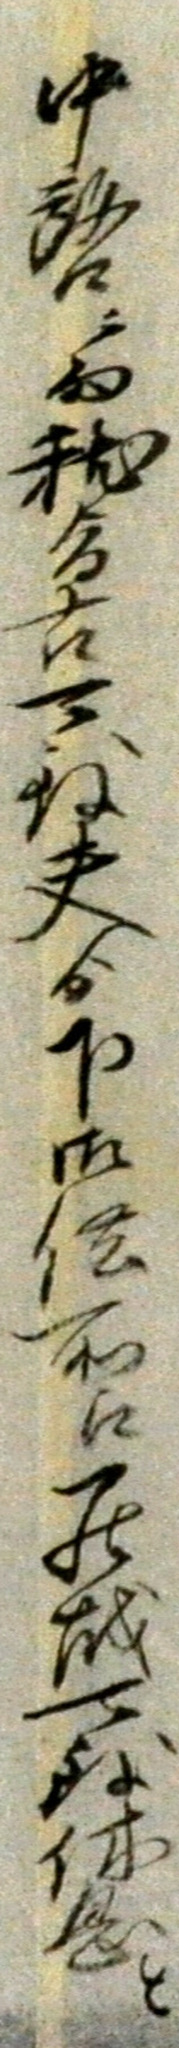中啓ニ而稽古可致夫ゟ下御供所え罷越可致休息と
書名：御鏡餅御用留（写）
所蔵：伊那市立高遠町図書館・合同会社AMANE
